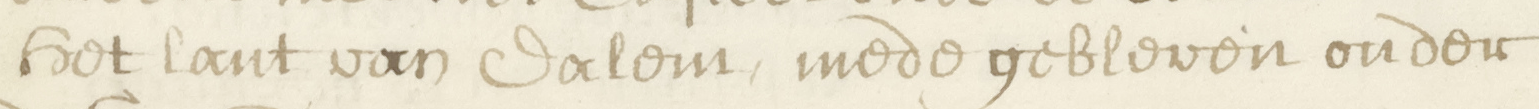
het lant van Dalem, mede gebleven onder
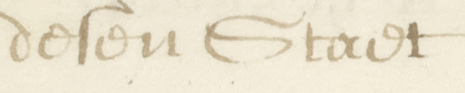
desen Staet
